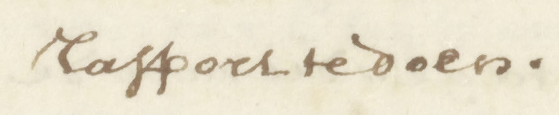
rapport te doen.
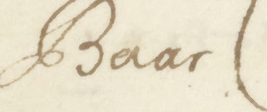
Baar
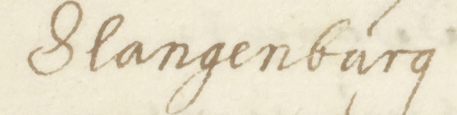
Slangenburg
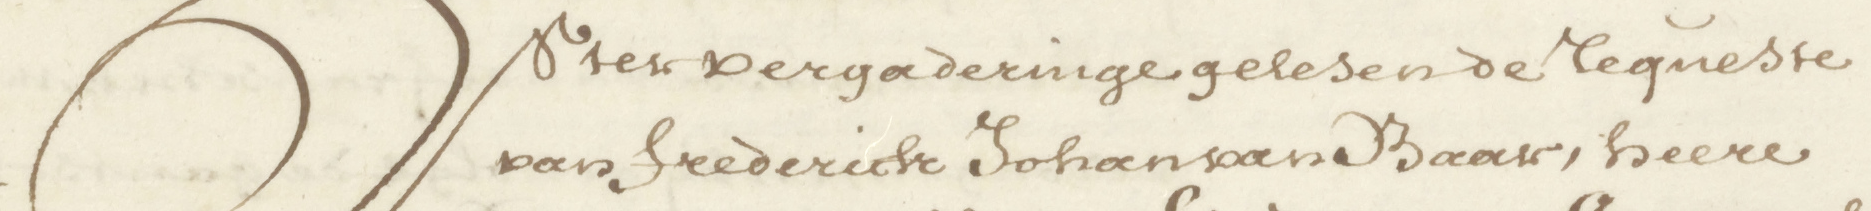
Is ter vergaderinge gelesen de requeste
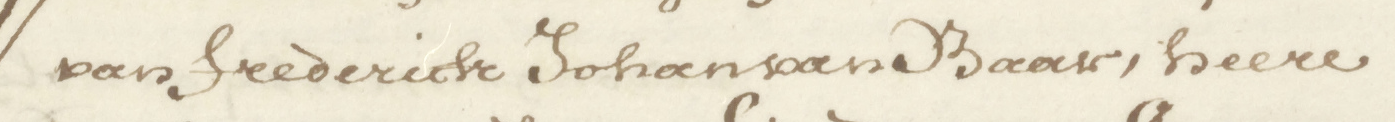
van Frederick Johan van Baar, heere
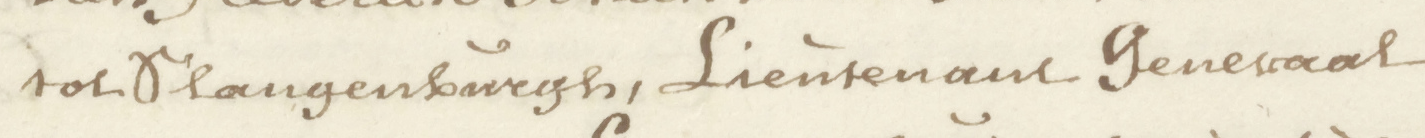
tot Slangenburgh, Lieutenant Generaal
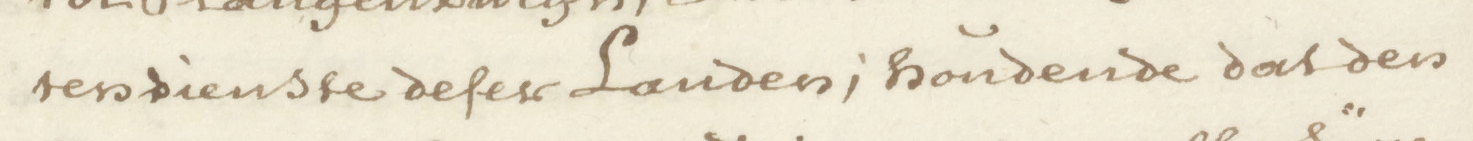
ten dienste deser Landen, houdende dat den
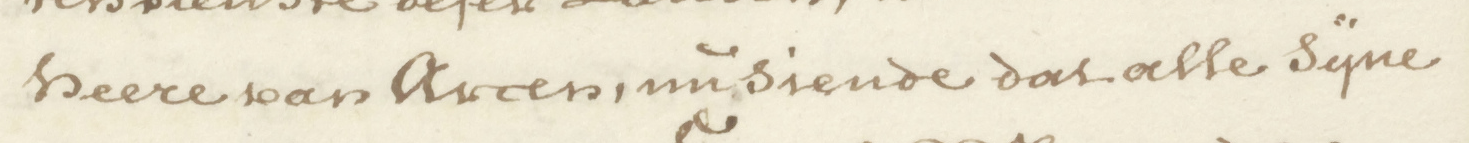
heere van Arcen, nu siende dat alle sijne
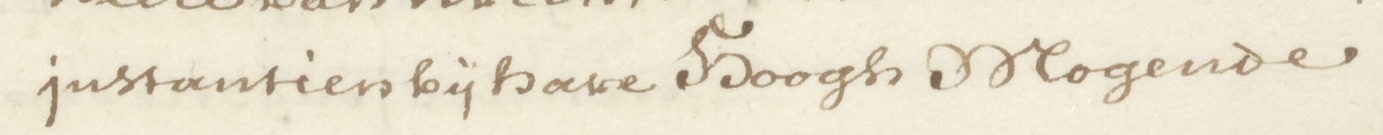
instantien bij hare Hoogh Mogende
